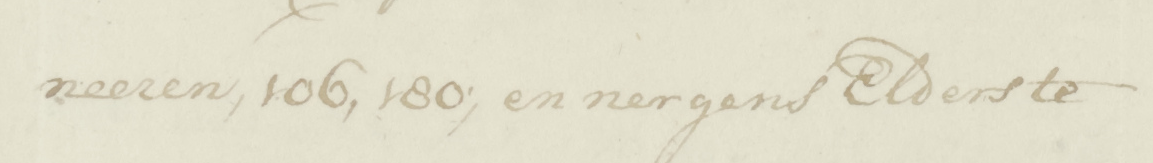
neeren,106, 180; en nergens Elders te
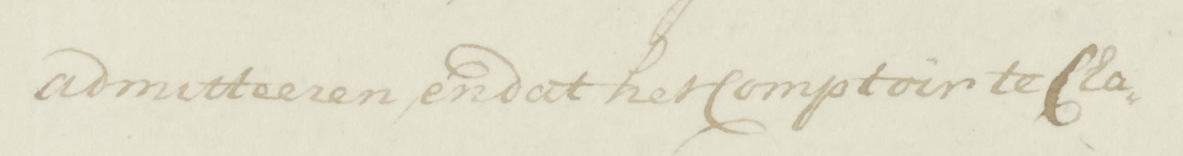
admitteeren, en dat het comptoir te Cla,,
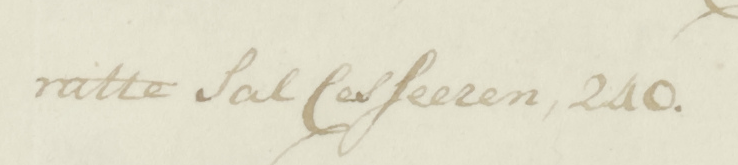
ratte sal cesseeren, 240.
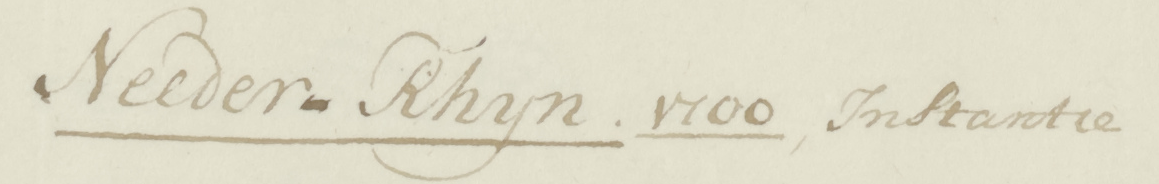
Needer-Rhyn, 1700, Instantie
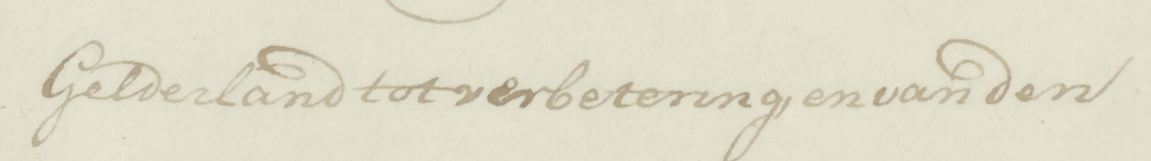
Gelderland tot verbeteringen van den
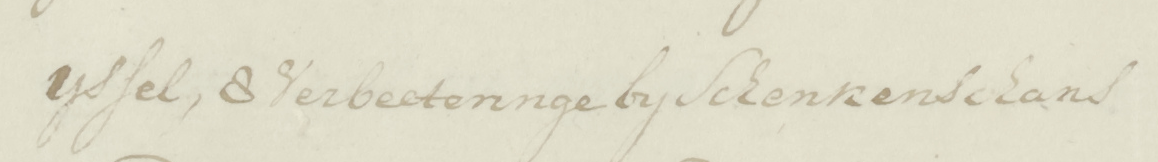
yssel, 8 Verbeeteringe by Schenkenschans
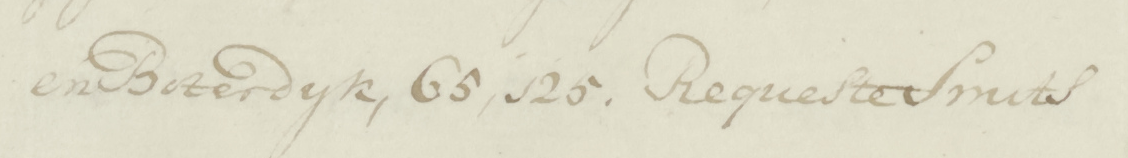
en Boterdyk, 65, 125. Requestes Smits
